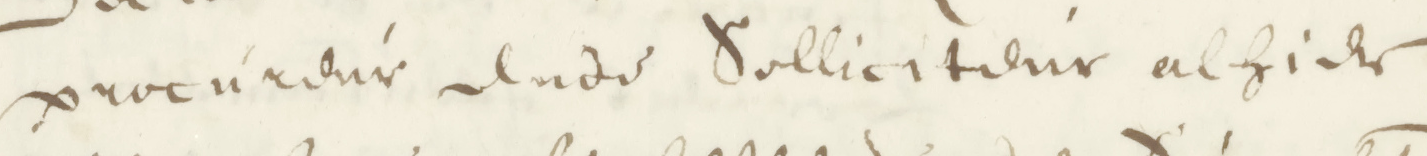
procureur ende Solliciteur alhier
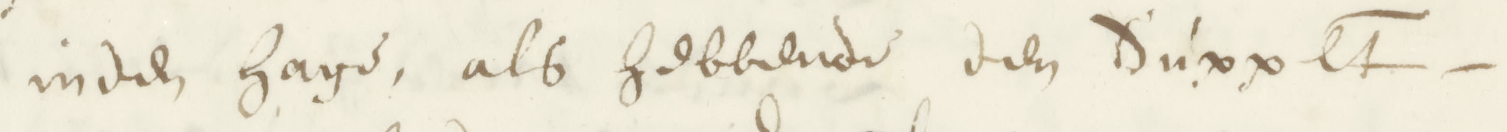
inden hage, als hebbende den Supplt.
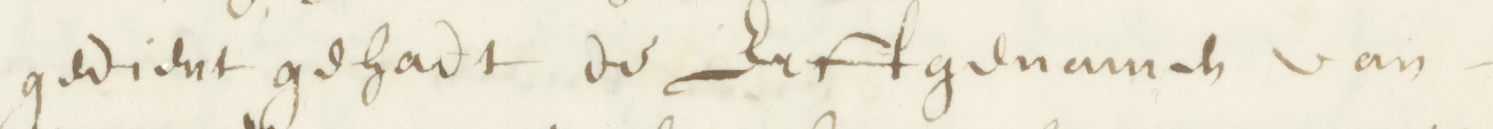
gedient gehadt de Erffgenamen van
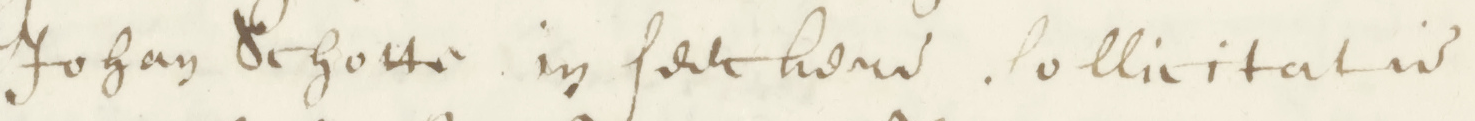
Johan Schotte in seeckere Sollicitatie
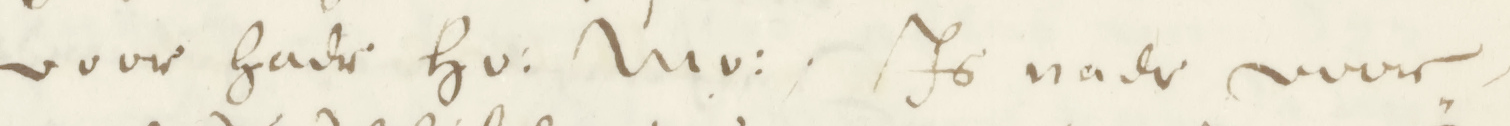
voor haer ho:Mo: Is naer voor
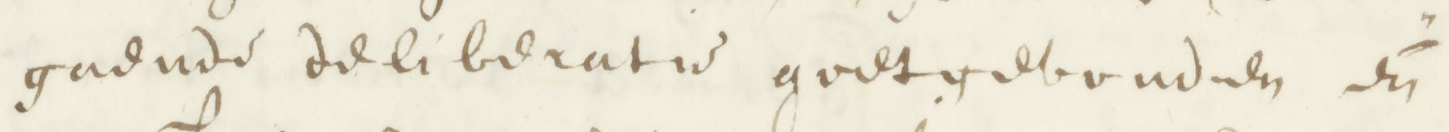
gaende deliberatie goetgevonden en
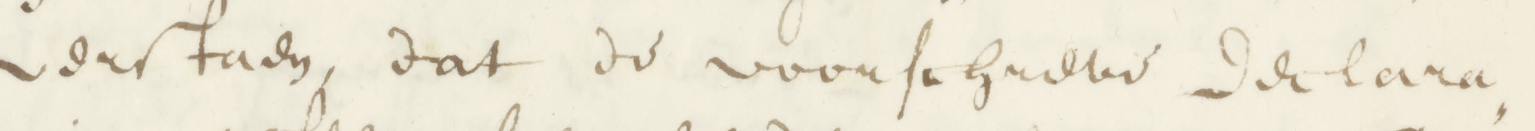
verstaen, dat de voorschreve Declara„
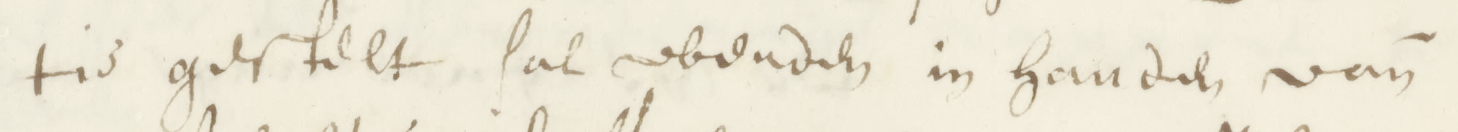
tie gestelt sal werden in handen van
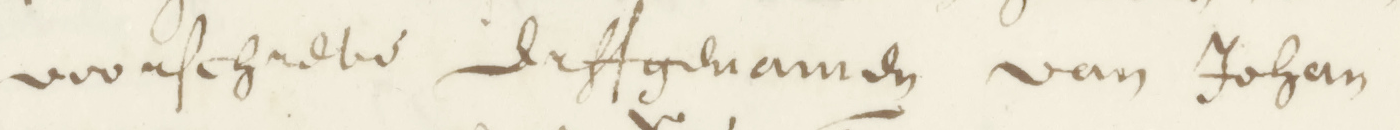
voorschreve Erffgenamen van Johan
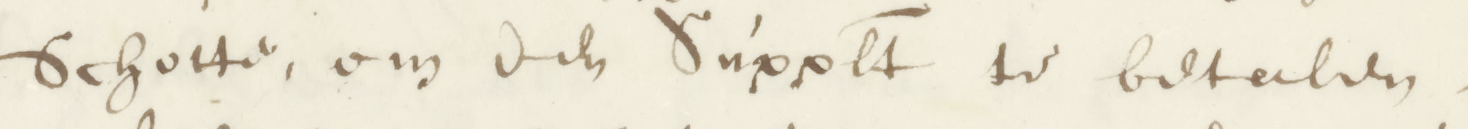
Schotte, om den Supplt te betalen
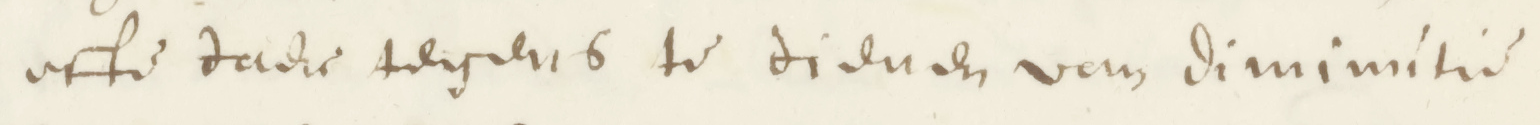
offe daer tegens te dienen van diminutie
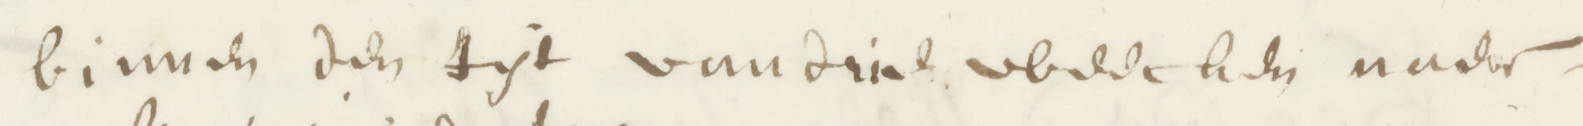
binnen den tijt van drie weecken naer
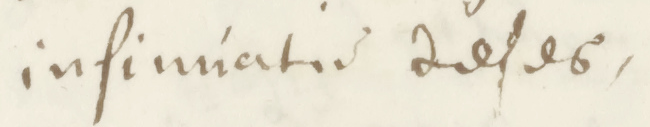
insinuatie deses.
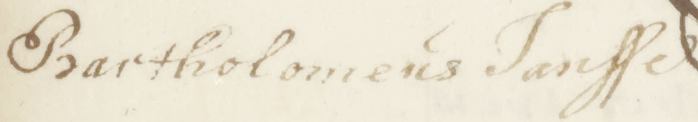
Bartholomeus Jansse
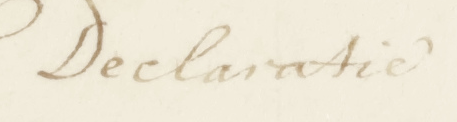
Declaratie
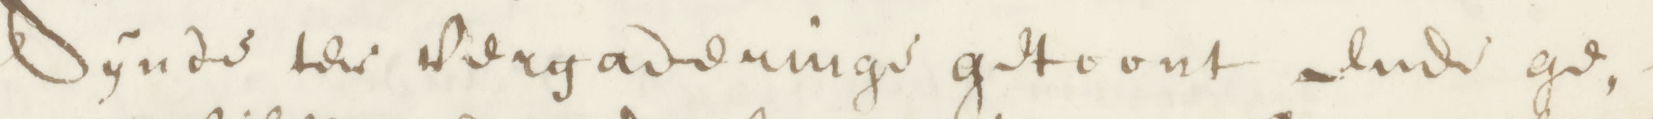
Sijnde ter vergaderinge getoont ende ge„
